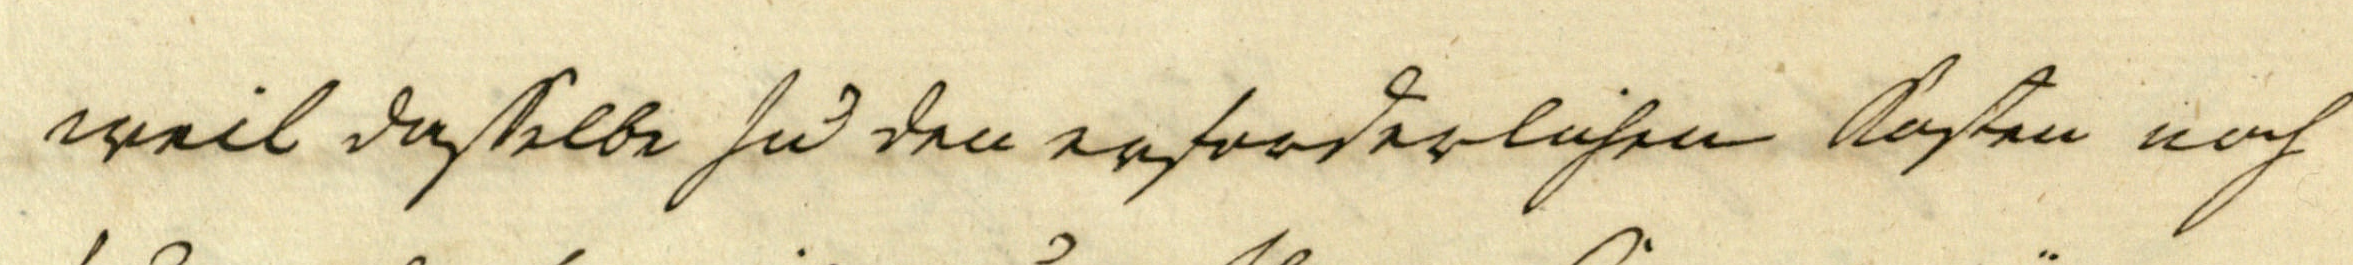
weil dasselbe zu den erforderlichen Kosten noch
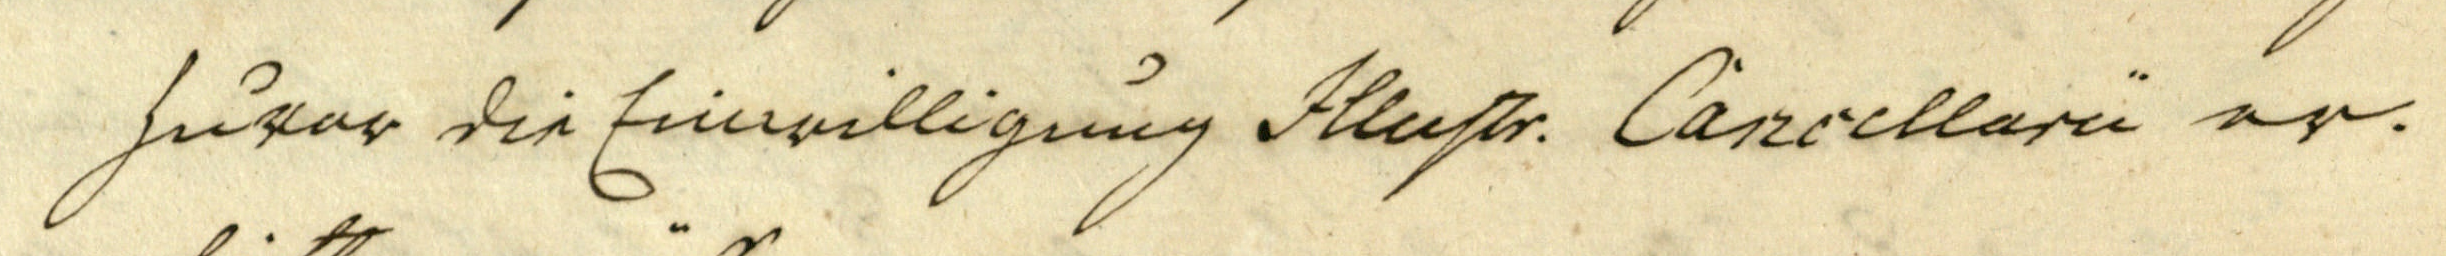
zuvor die Einwilligung Illustr. Cancellarii er¬
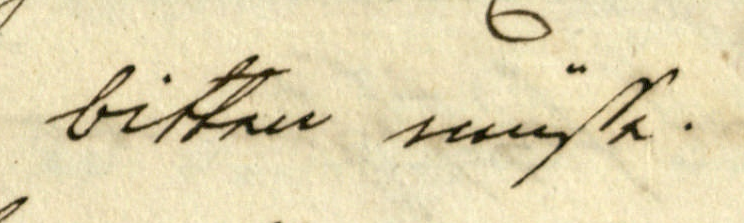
bitten müsse.
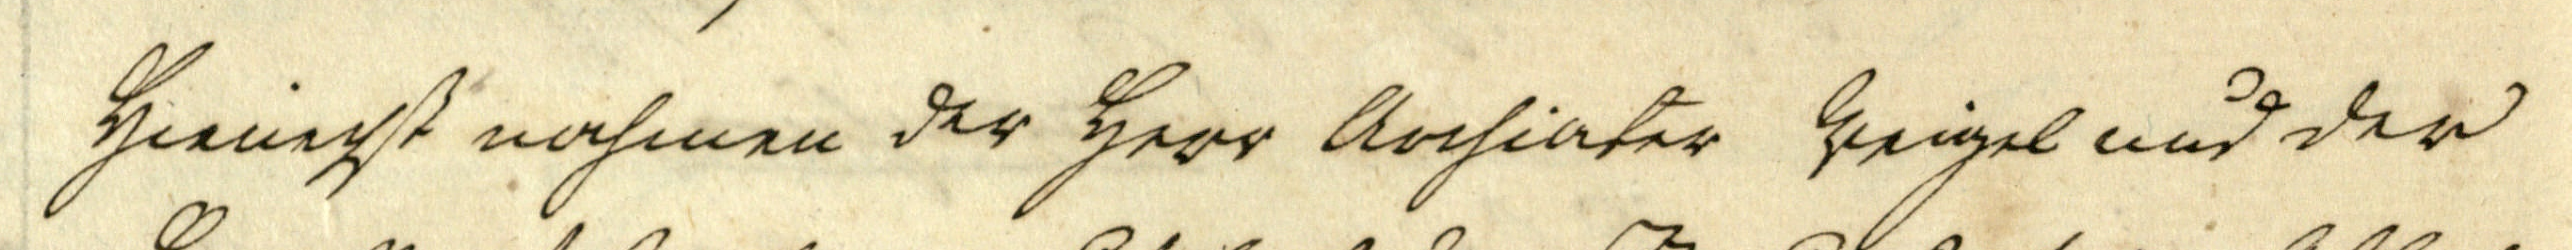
Hienechst nahmen der Herr Archiater Weigel und der
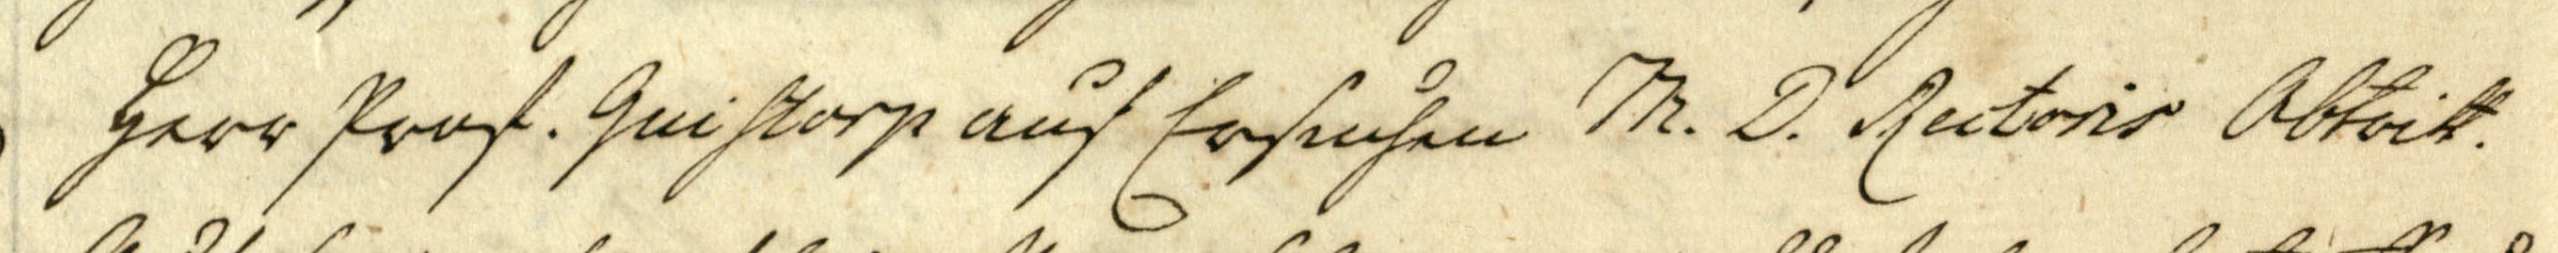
Herr Prof. Quistorp auf Ersuchen M. D. Rectoris Abtritt.
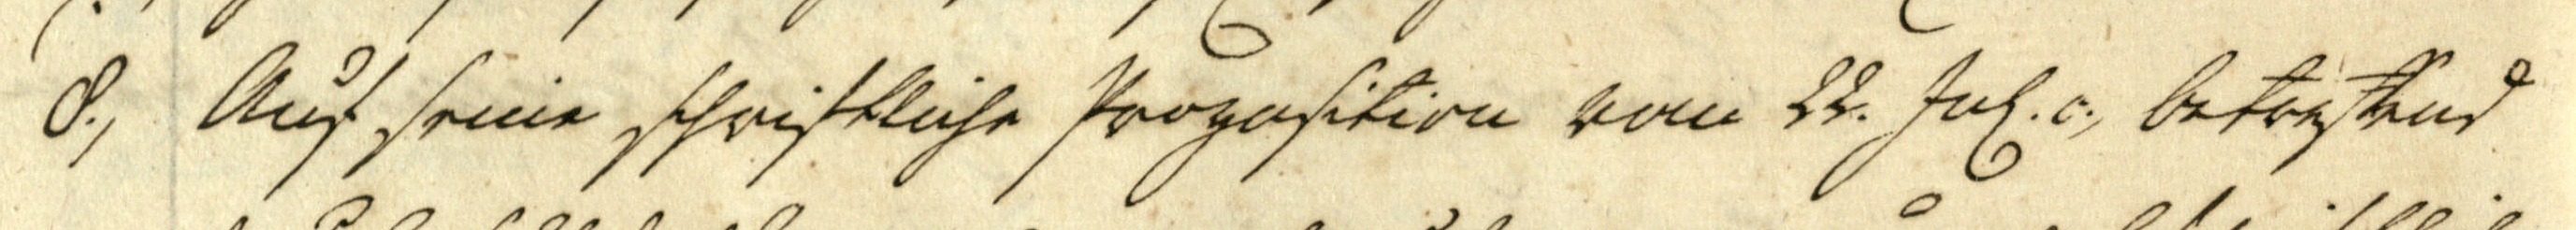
8., Auf seine schriftliche Proposition vom 22. Jul. c., betreffend
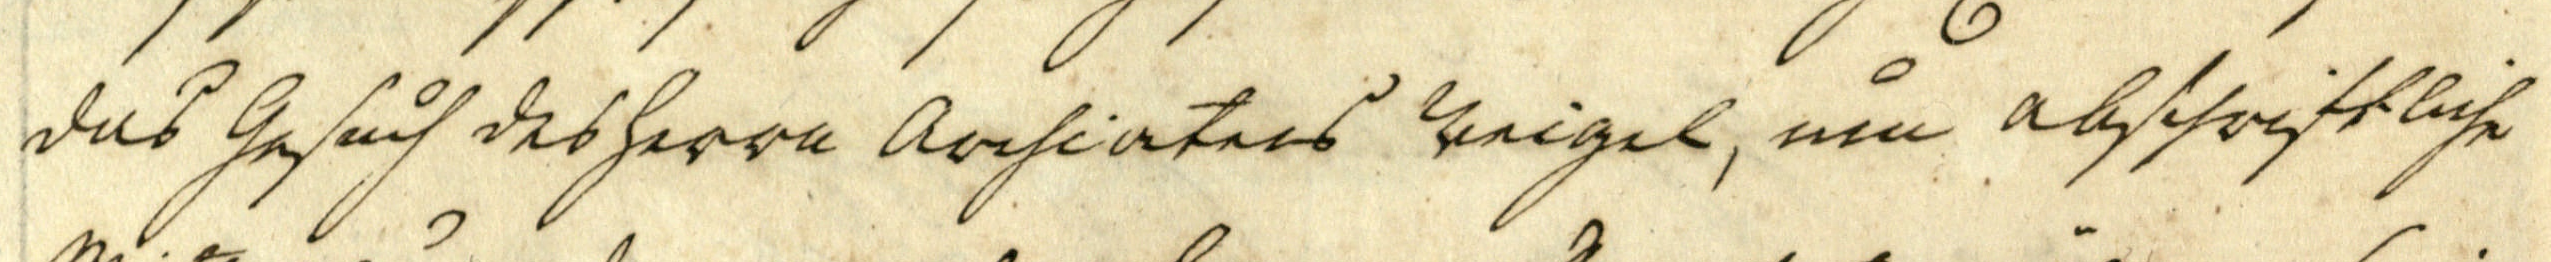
das Gesuch des Herrn Archiaters Weigel, um abschriftliche
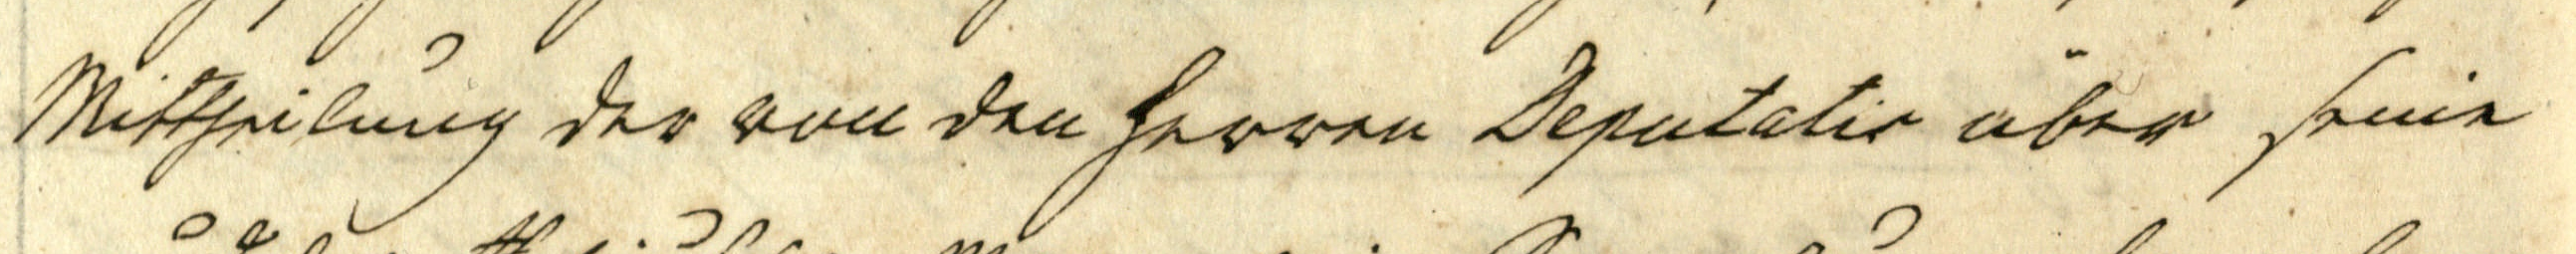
Mittheilung der von den Herren Deputatis über seine
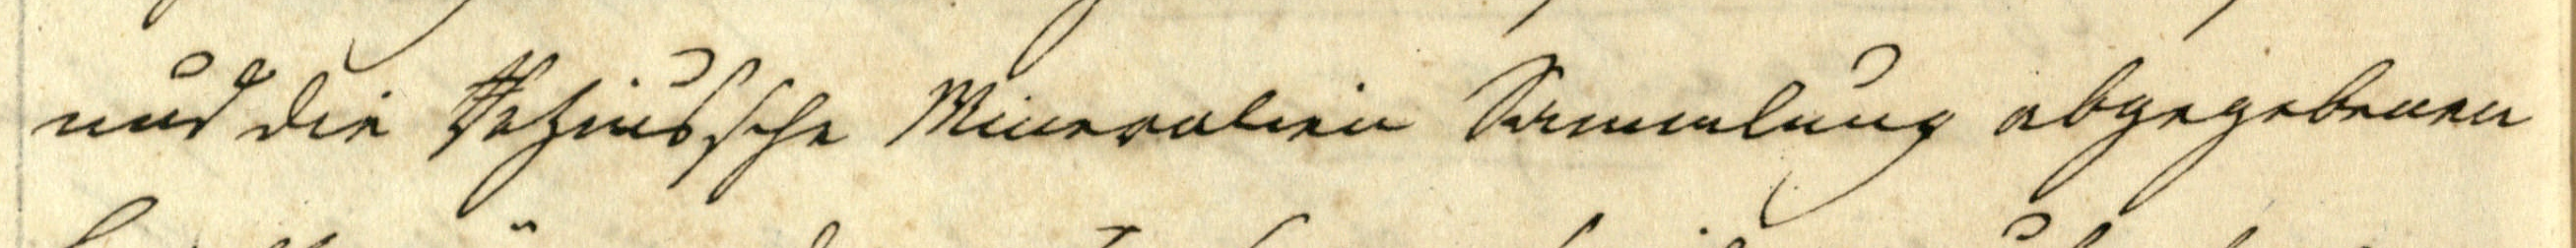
und die Rezinssche Mineralien Sammlung abgegebenen
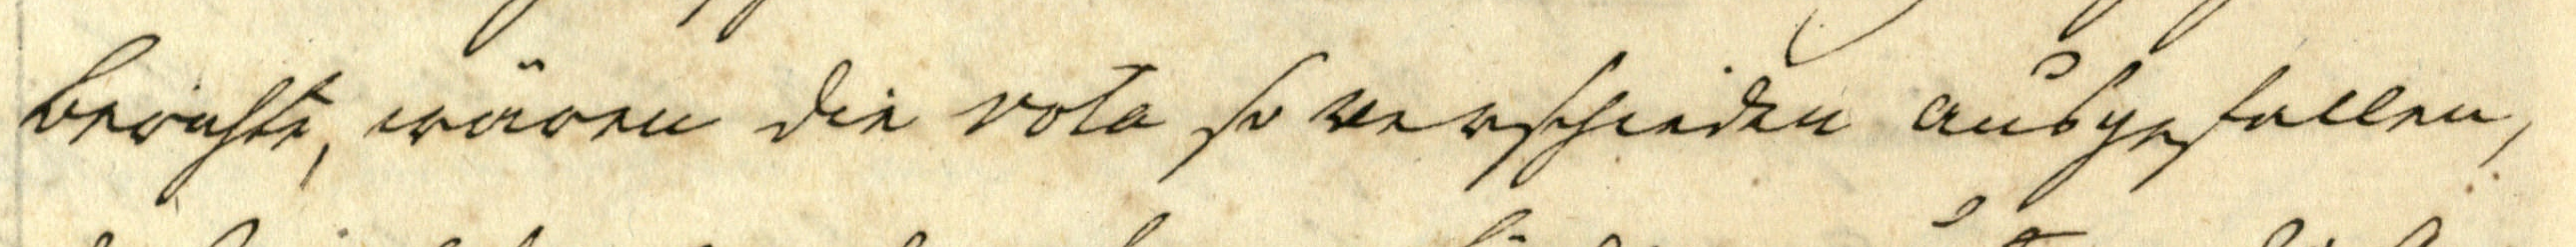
Berichte, wären die vota so verschieden ausgefallen,
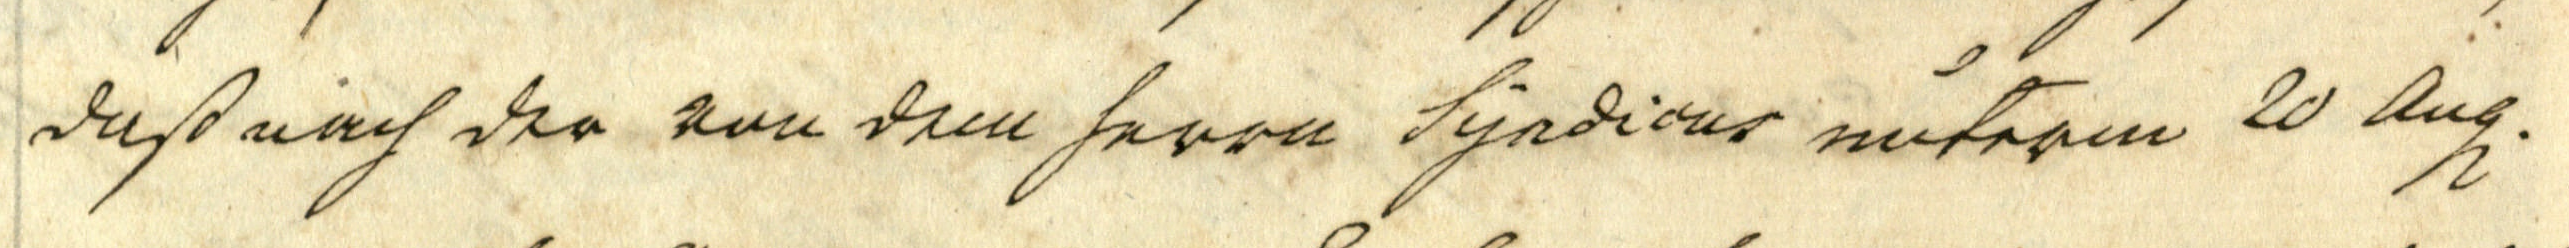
daß nach der von dem Herrn Sÿndicus unterm 20. Aug.
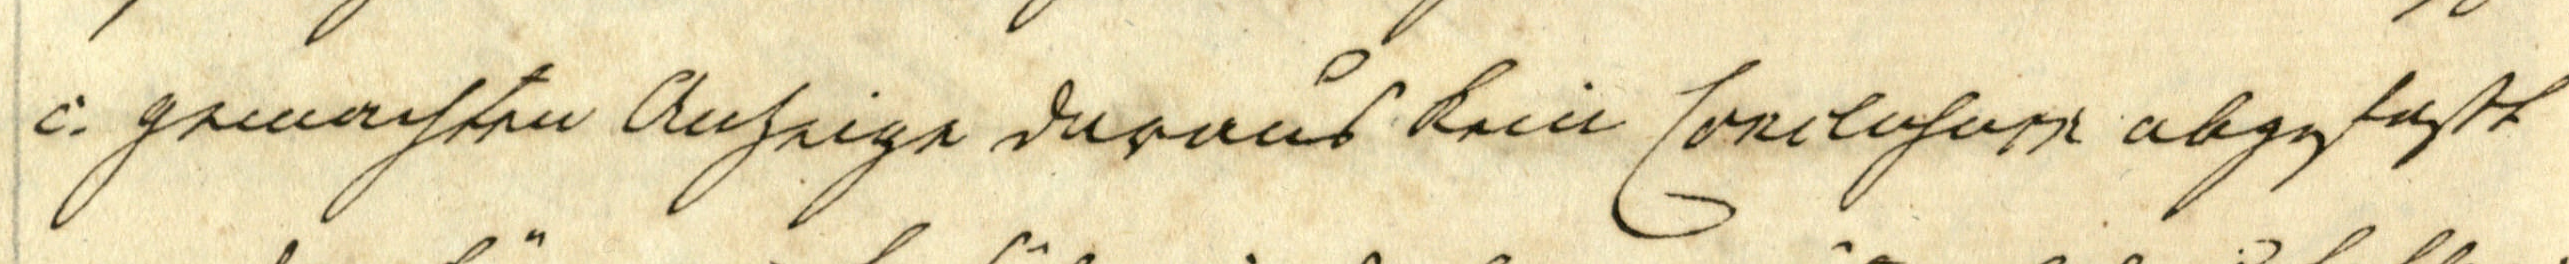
c. gemachten Anzeige daraus kein Conclusum abgefaßt
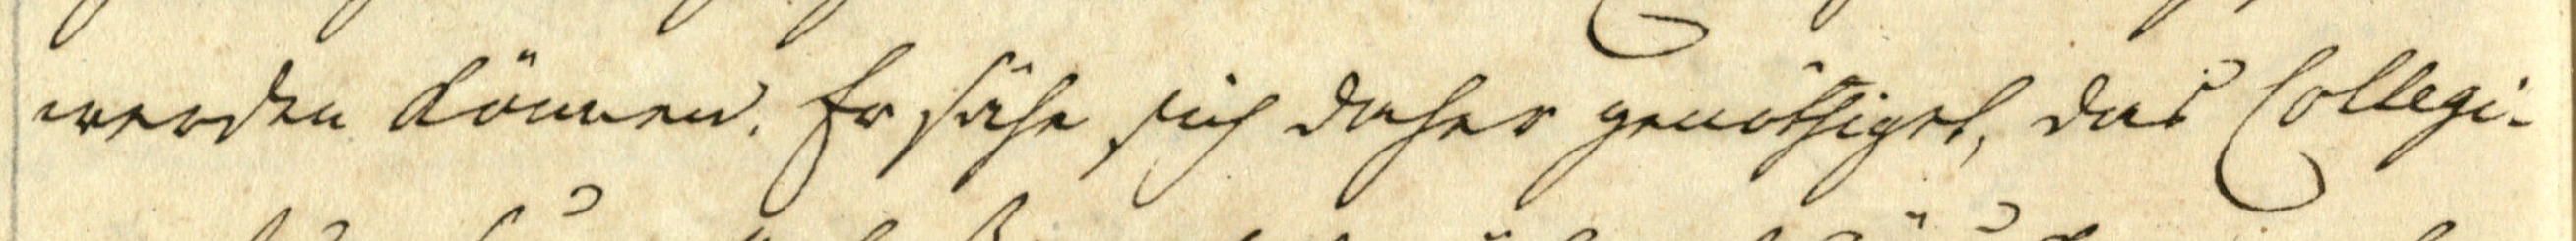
werden können. Er sähe sich daher genöthiget, das Collegi¬
